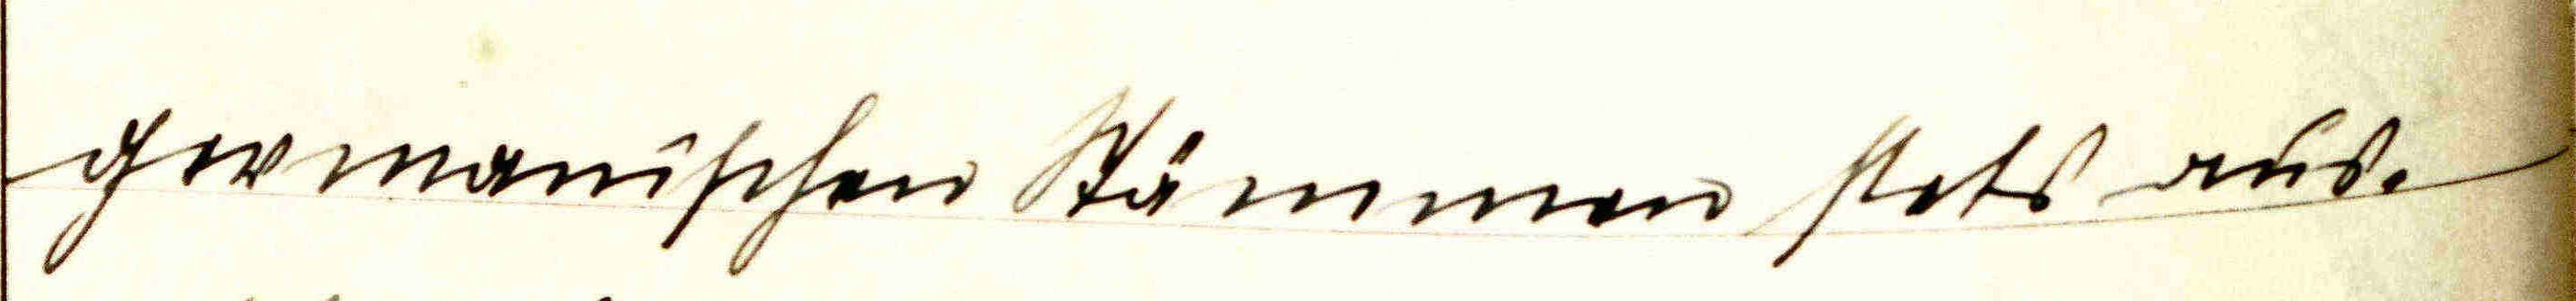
germanischen Stämmen steht aus-
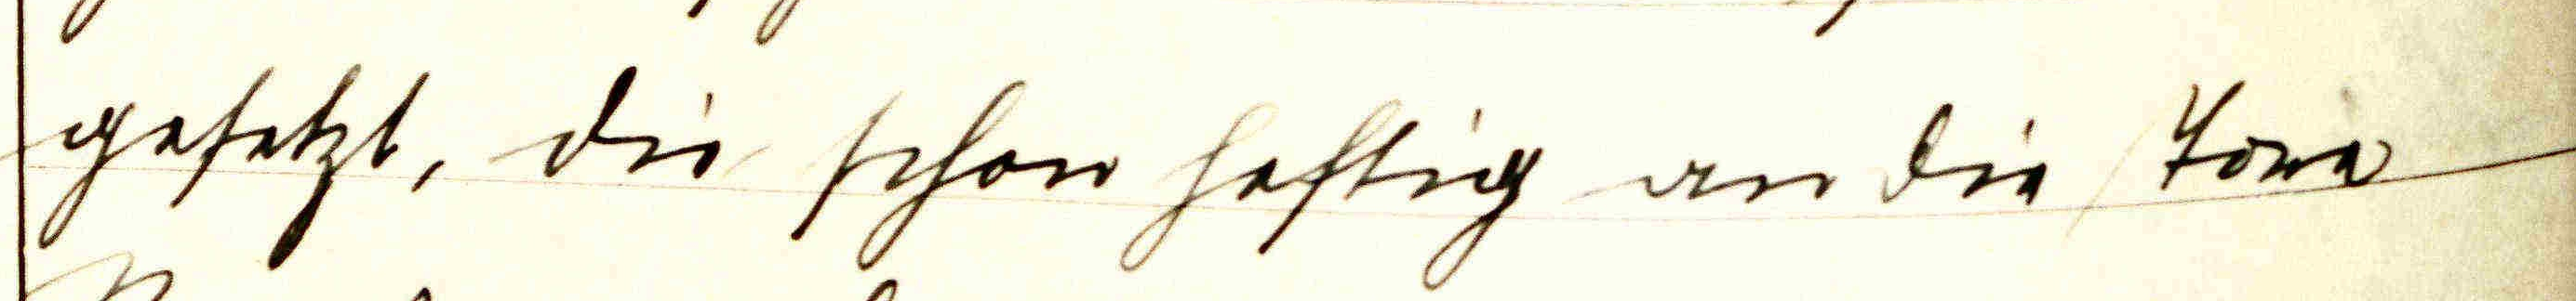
gesetzt, die schon heftig an die Tore
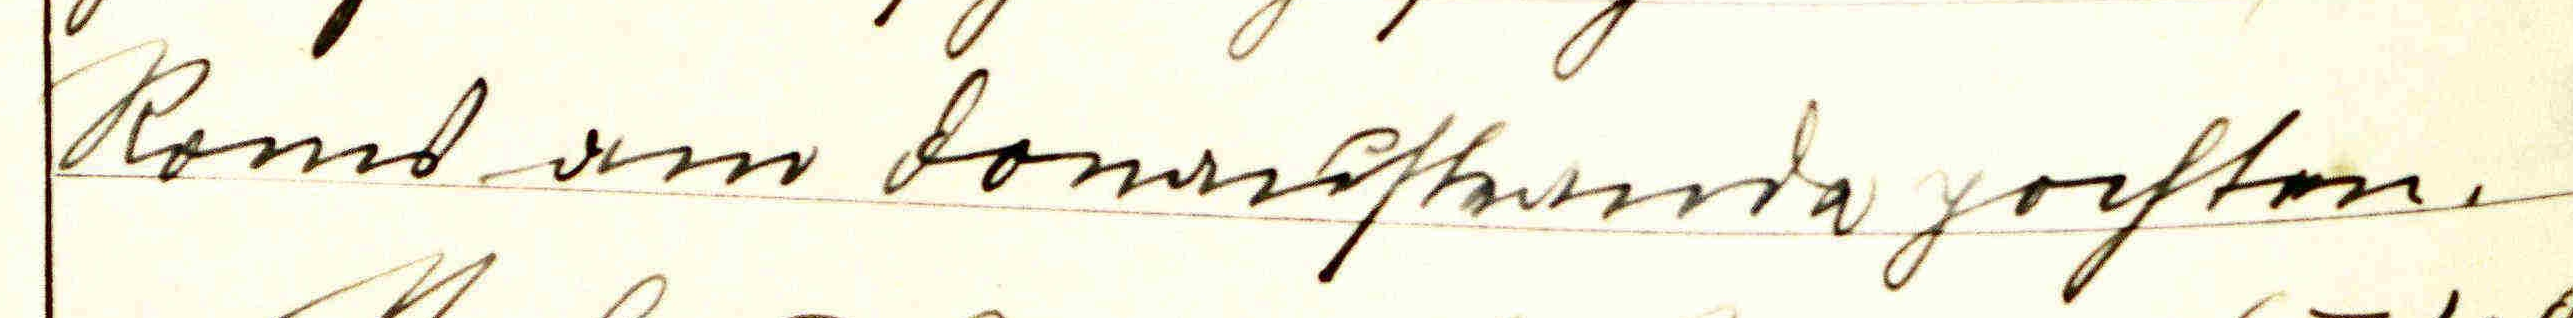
Roms am Donaustrande pochten.
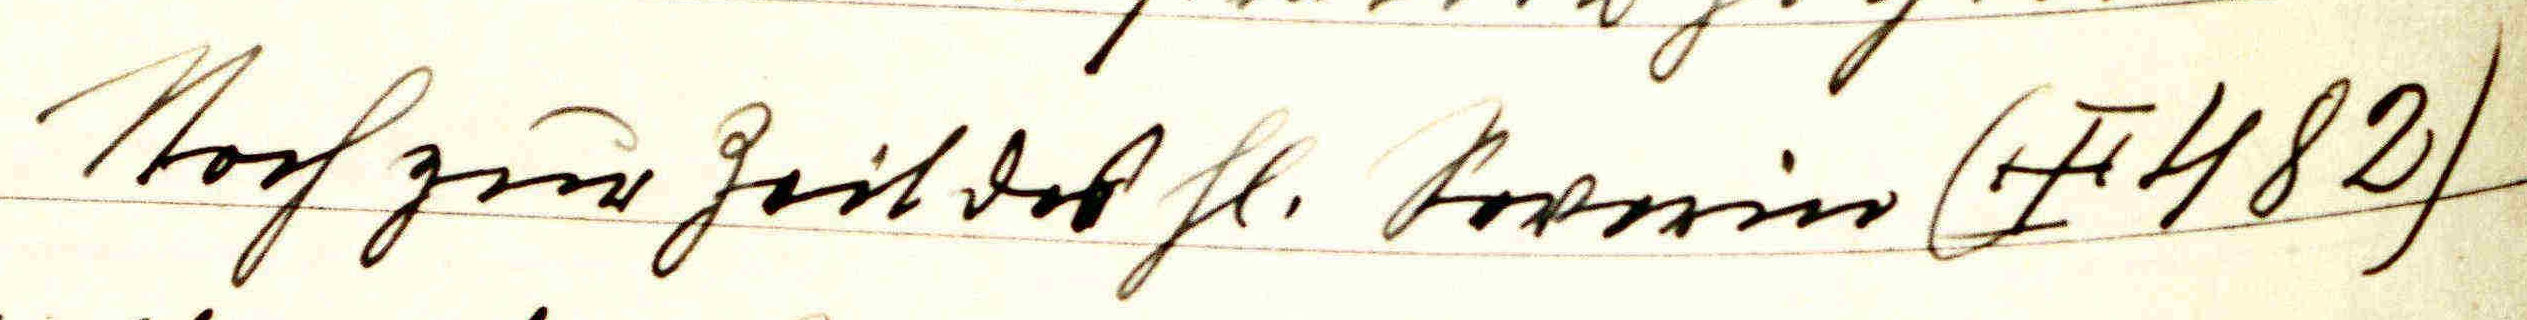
Noch zur Zeit des Hl. Severin (+ 482)
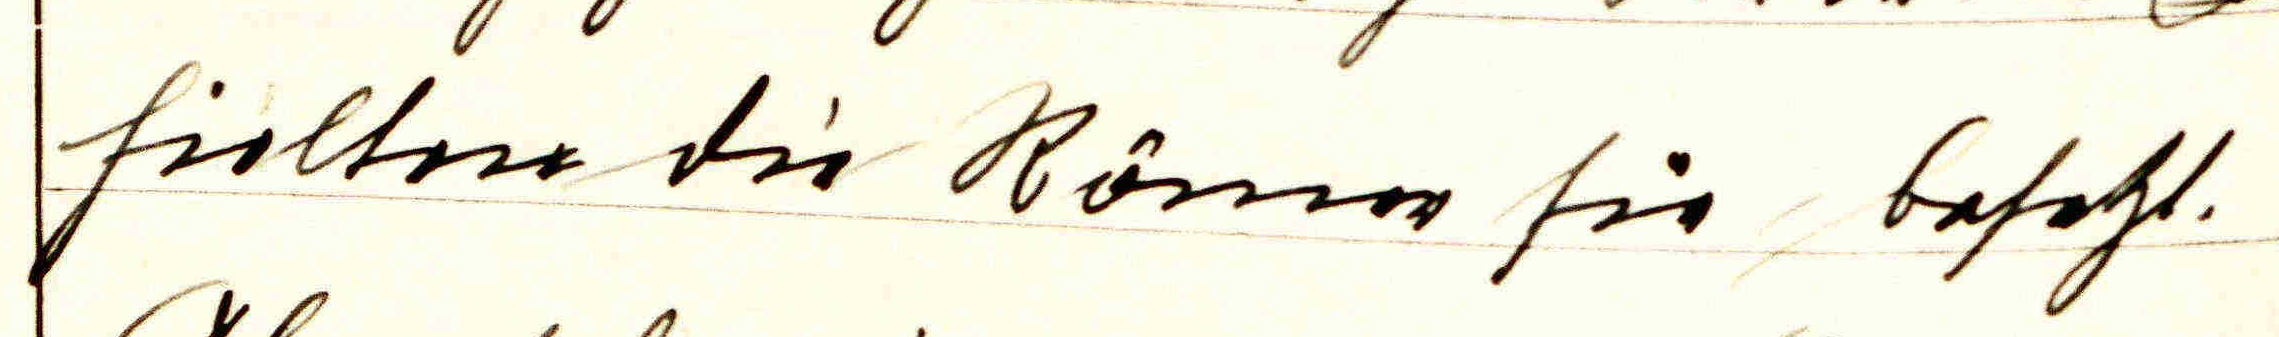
hielten die Römer sie besetzt.
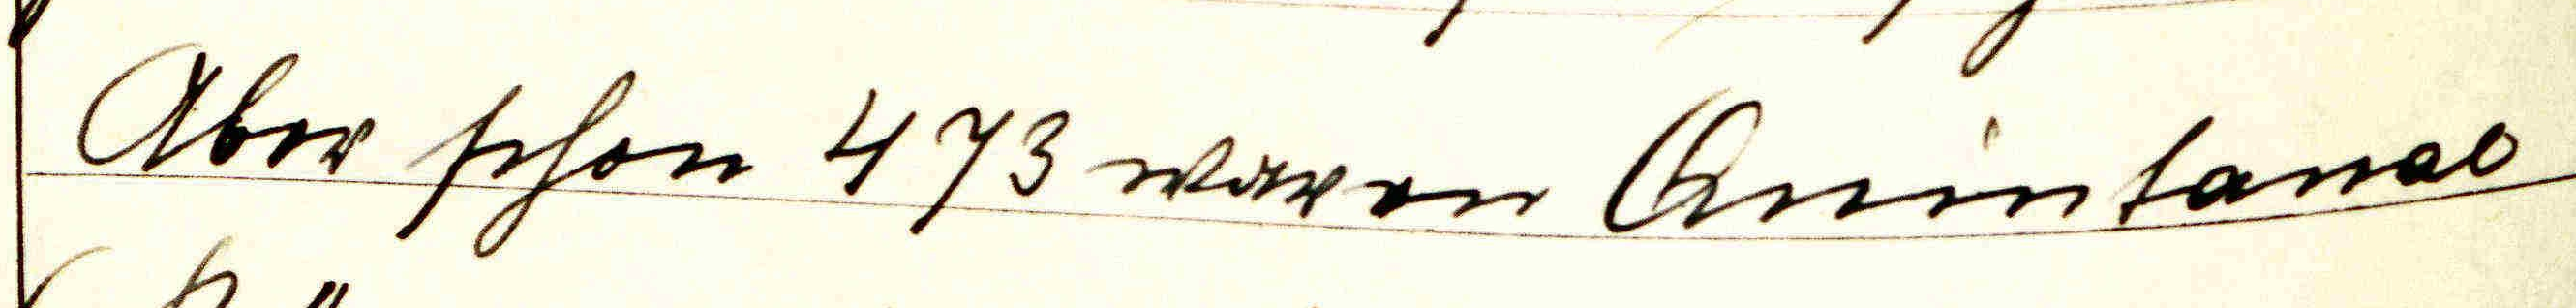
Aber schon 473 waren Quintanac
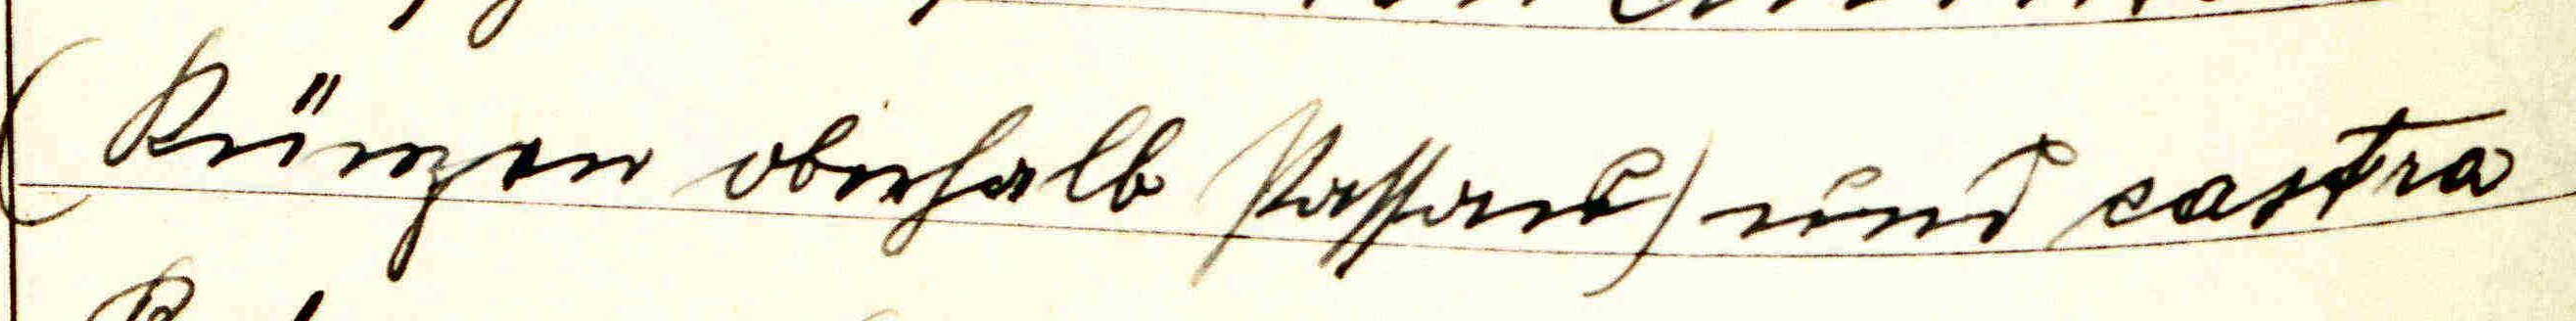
(Rünzen oberhalb Passau) und castra
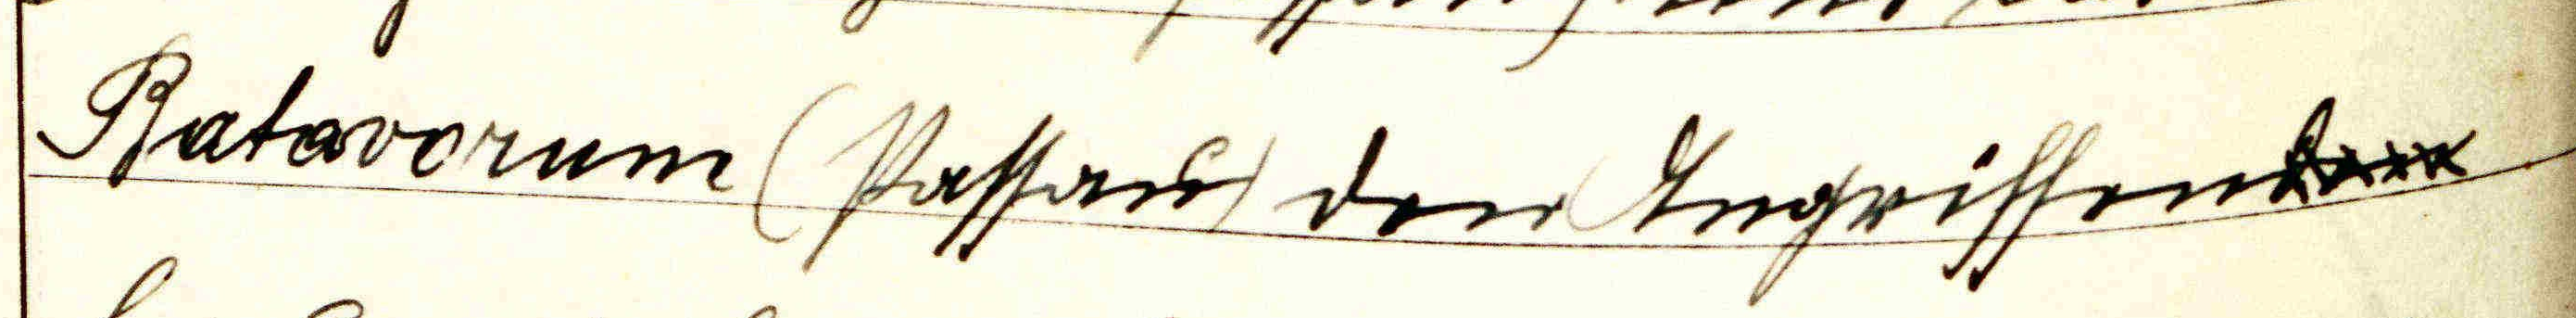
Batavorum (Passau) den Angriffen
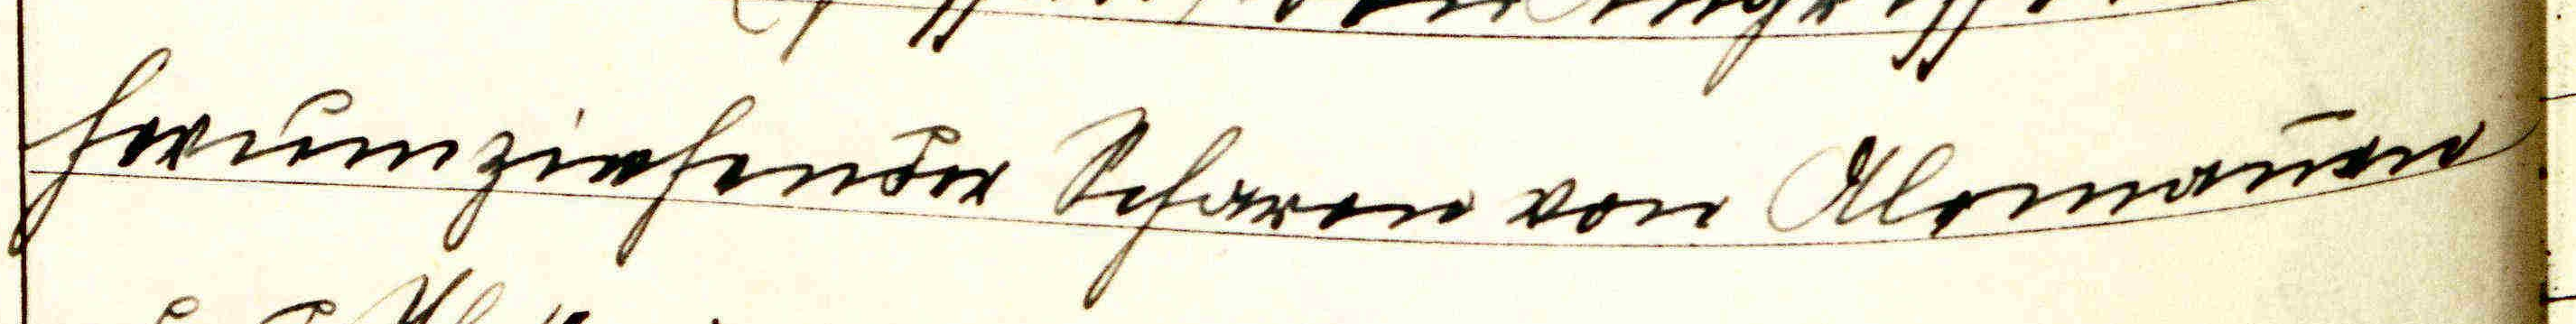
herumziehender Scharen von Alemannen
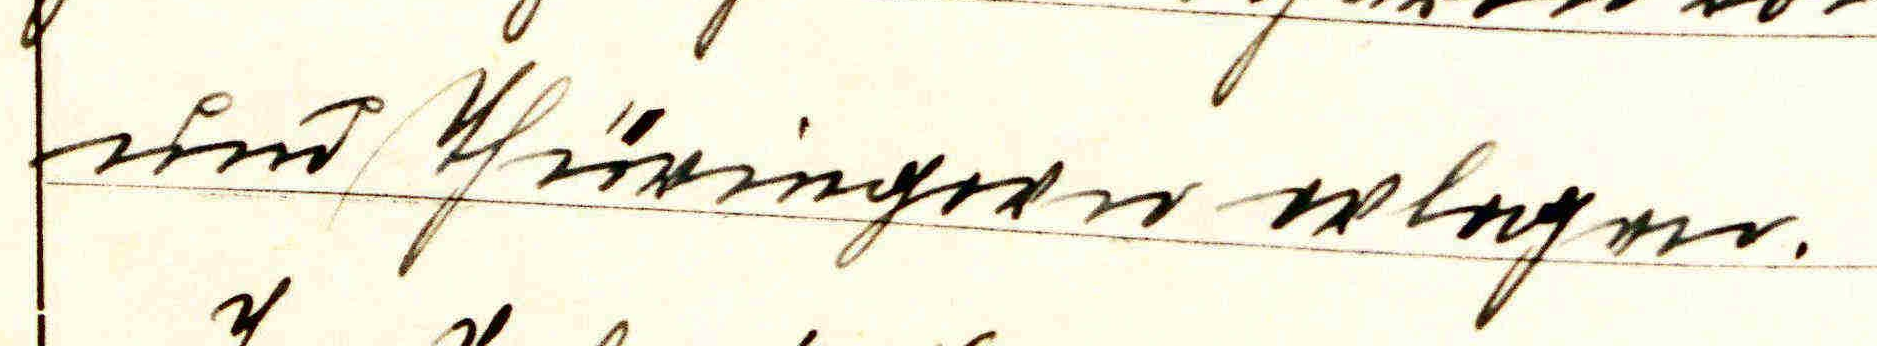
und Thüringern erlegen.
